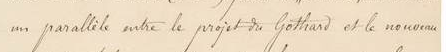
un parallèle entre le projet du Gothard et le nouveau
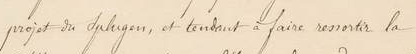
projet du Splugen, et tendant à faire ressortir la
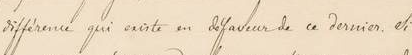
différence qui existe en défaveur de ce dernier. Si
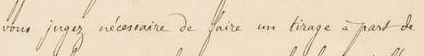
vous jugez nécessaire de faire un tirage à part de
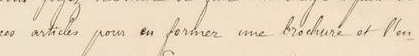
ces articles pour en former une brochure et l'en-
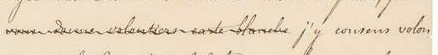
vous donne volentiers carte blanche j'y consens volon--
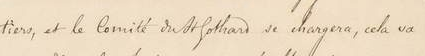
tiers, et le Comité du St. Gothard se chargera, cela va
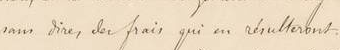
sans dire, des frais qui en résulteront.
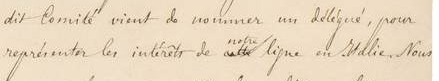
représenter les intérêts de cettenotre ligne
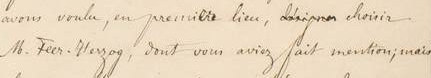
M. Feer-Herzog, dont vous aviez fait mention; mais
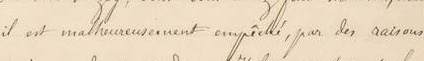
il est malheureusement empêché, par des raisons
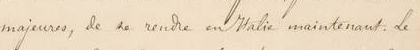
majeures, de se rendre en Italie maintenant. Le
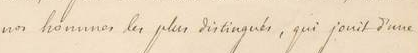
nos hommes les plus distingués, qui jouit d'une
